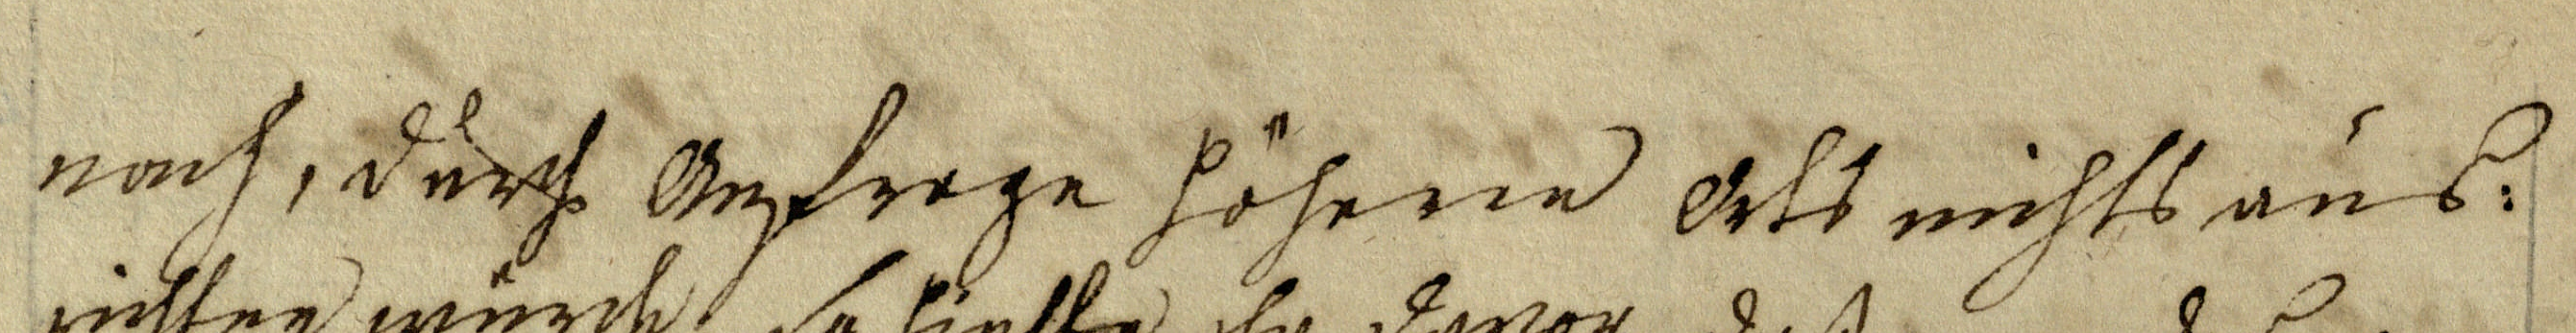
nach, durch Anfrage höheren Orts nichts aus¬
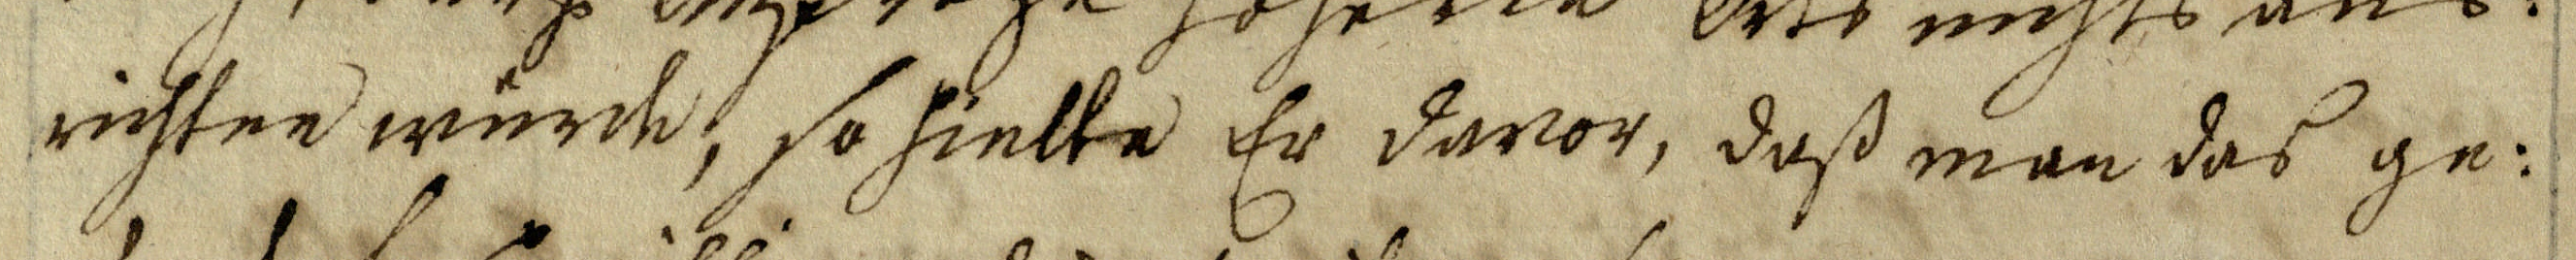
richten würde; so hielte Er davor, daß man das ge¬
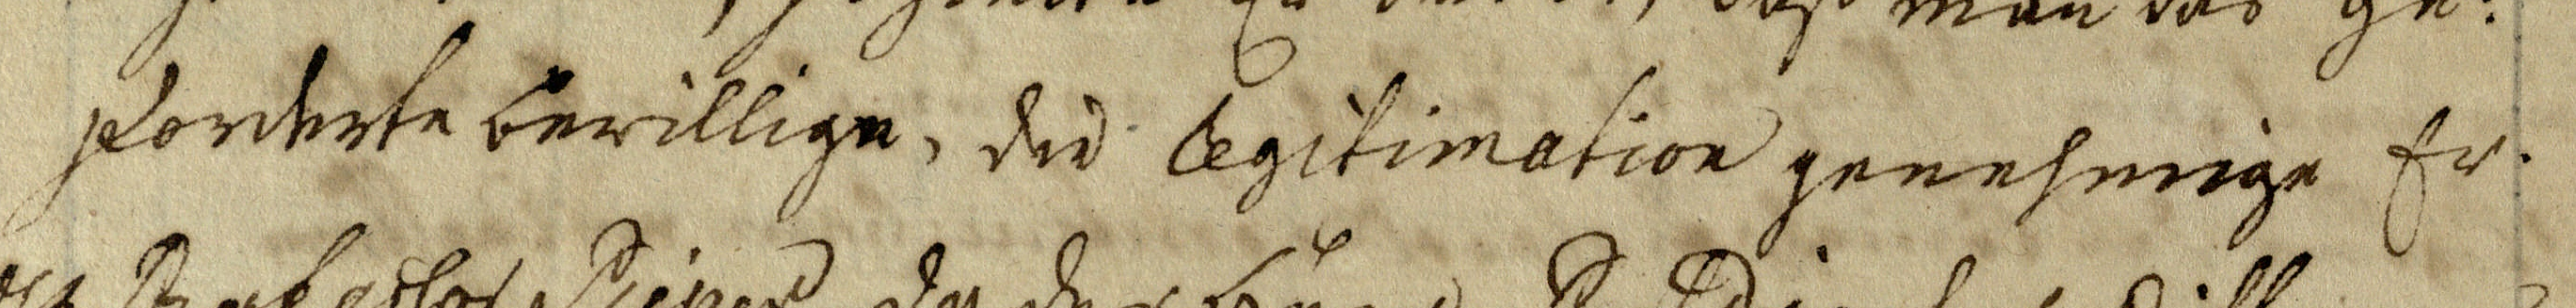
forderte bewillige, der legitimation genehmige Er.
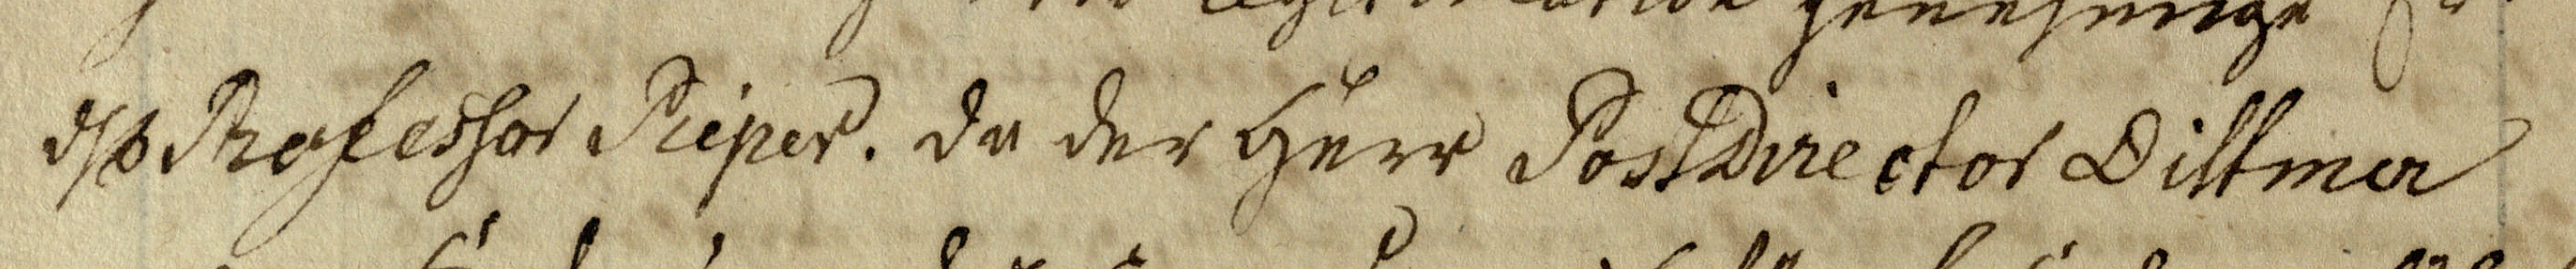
dh Professor Pieper. Da der Herr PostDirector Dittmer
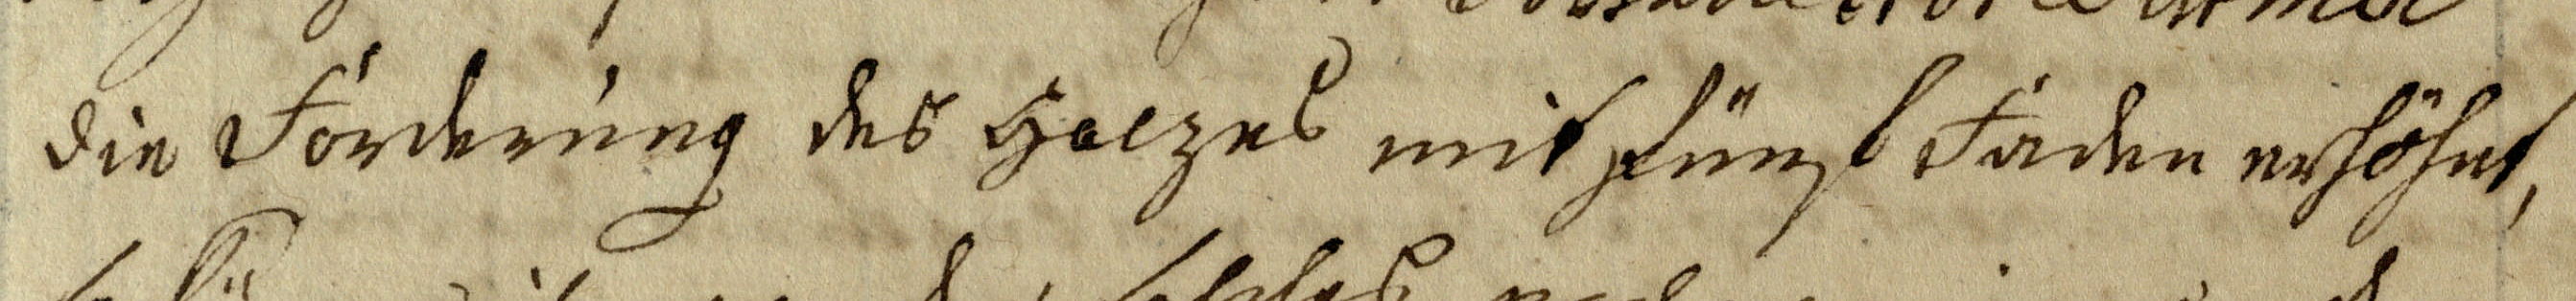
die Forderung des Holzes mit fünf Faden erhöhet,
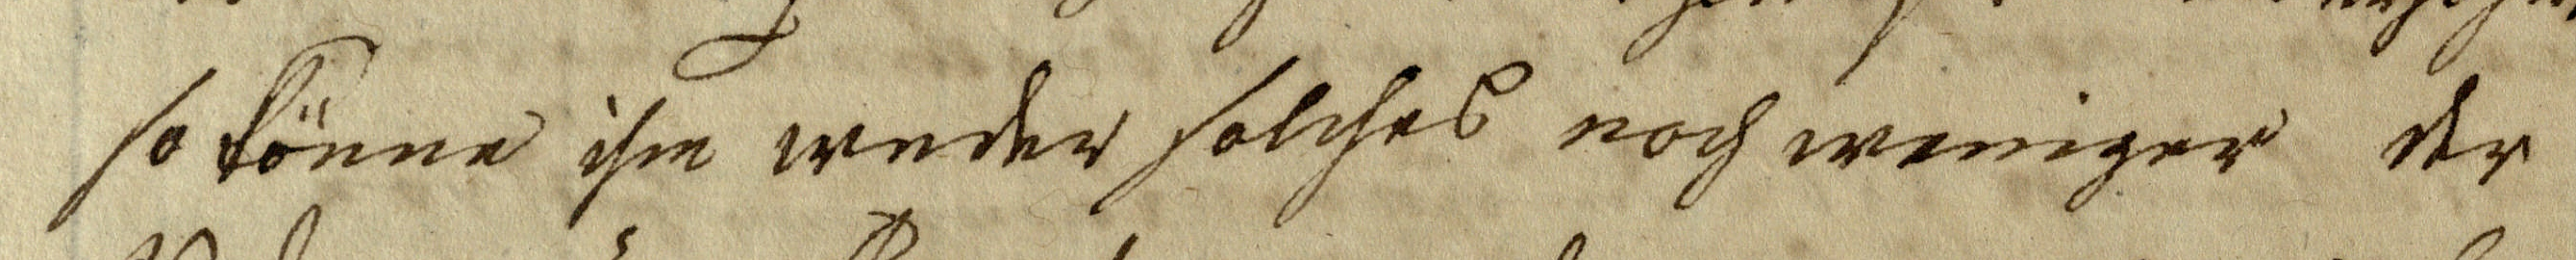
so könne ihm weder solches noch weniger der
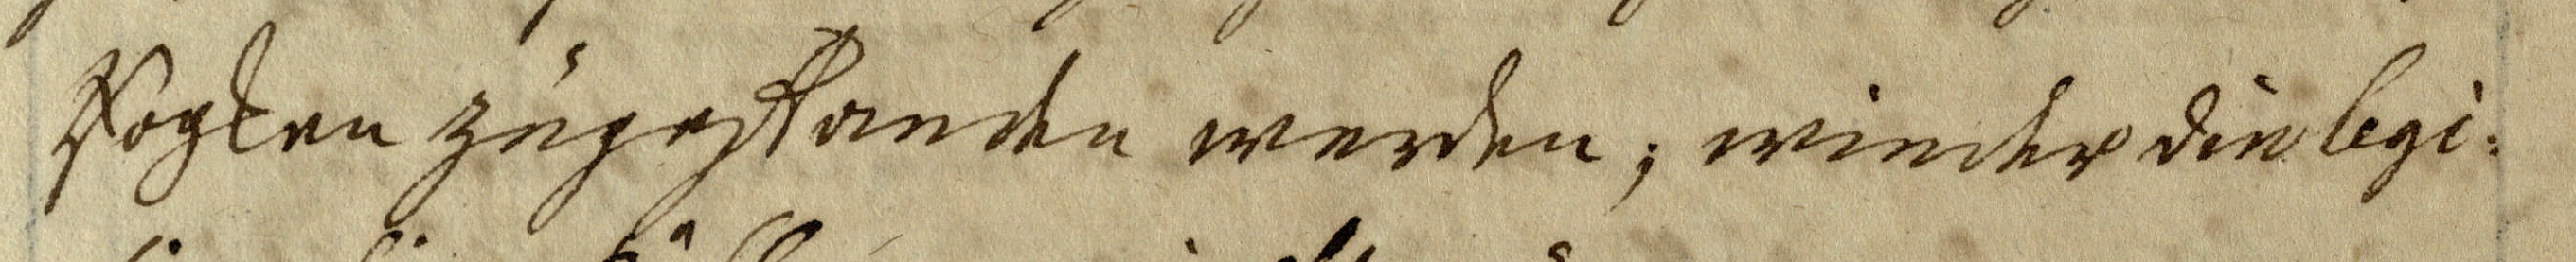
Rogken zugestanden werden, wieder die legi¬
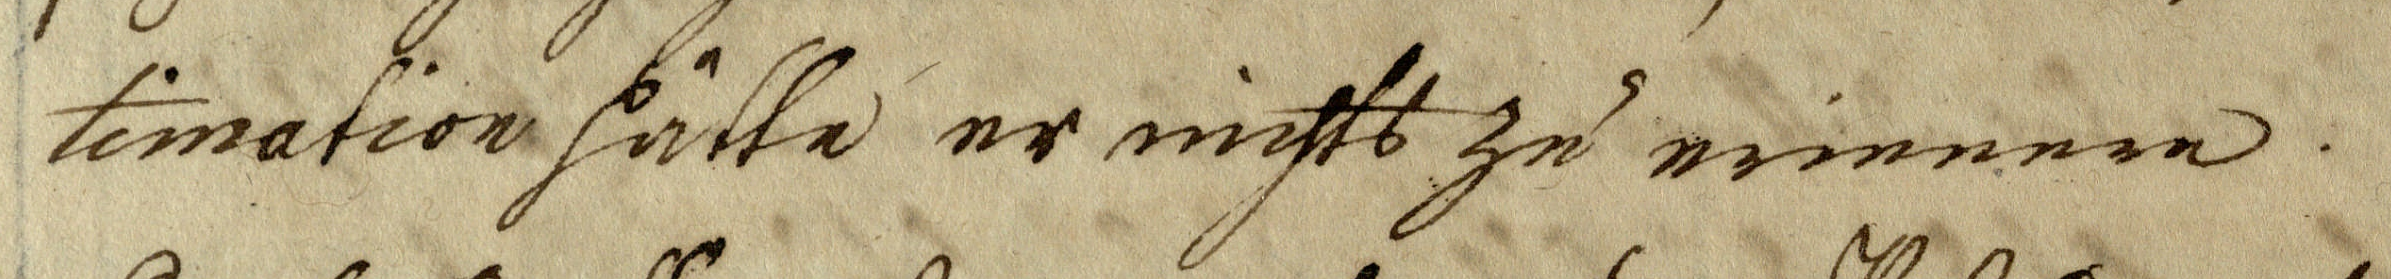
timation hätte er nichts zu erinnern.
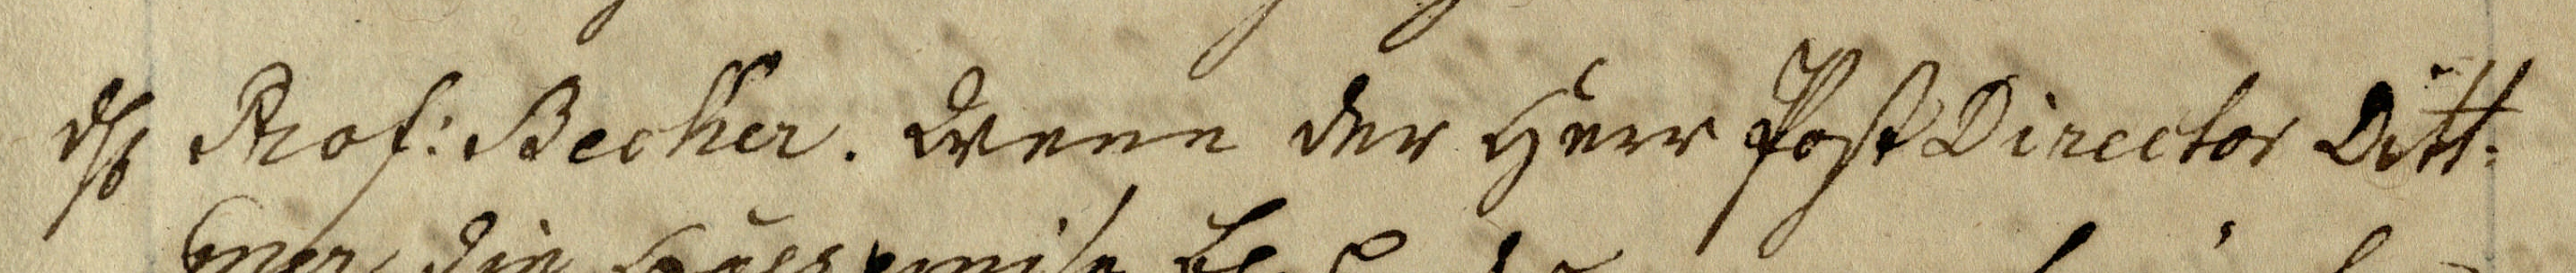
dh Prof. Becker. Wenn der Herr PostDirector Ditt¬
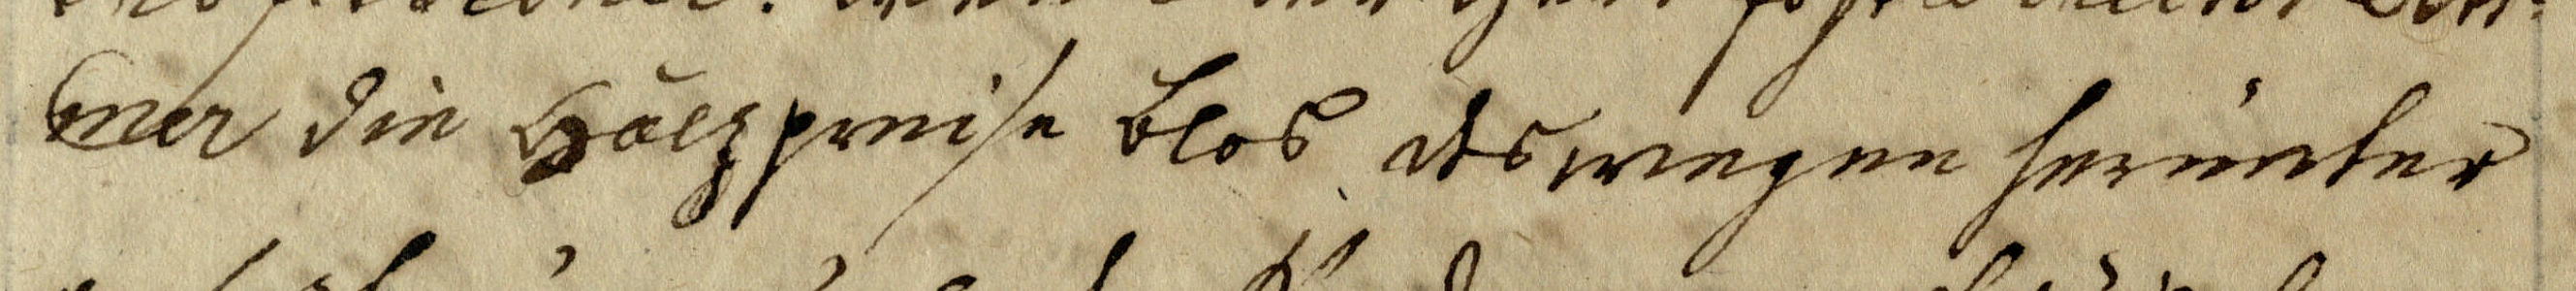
mer die Holzpreise blos des wegen herunter
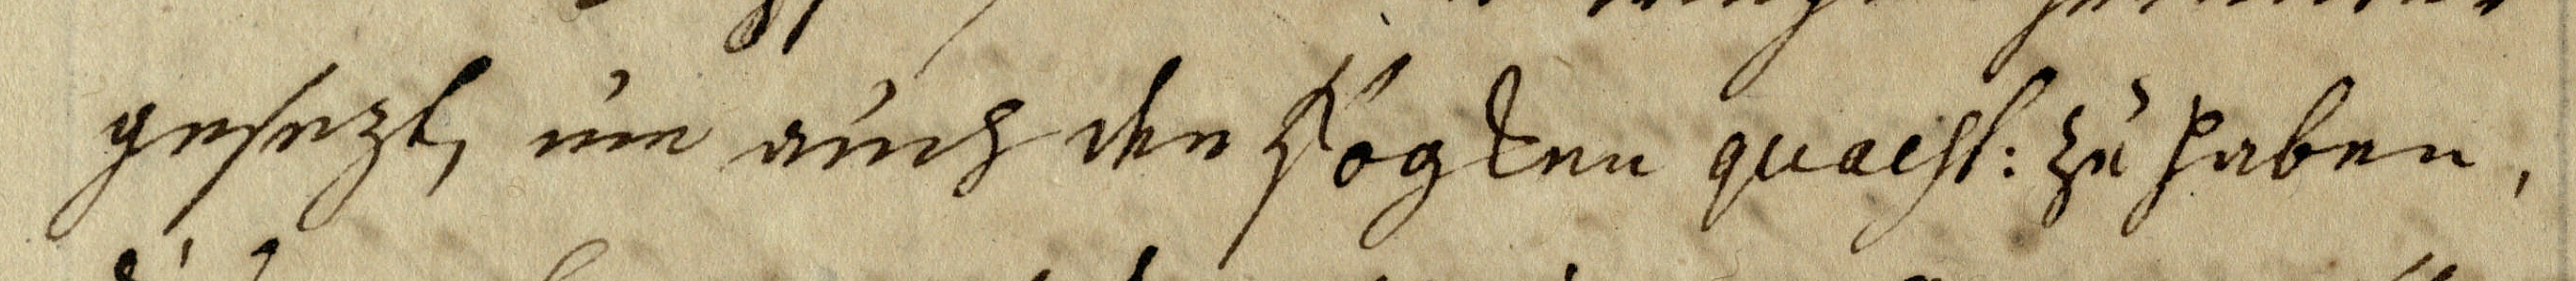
gesezt, in auch den Rogken quaest. zu haben,
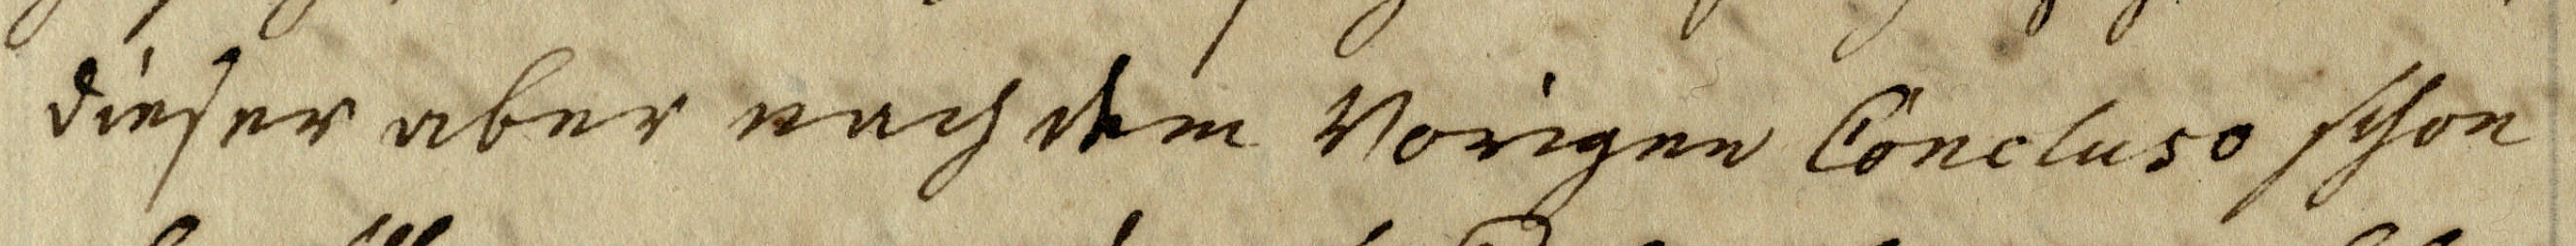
dieser aber nach dem vorigen Concluso schon
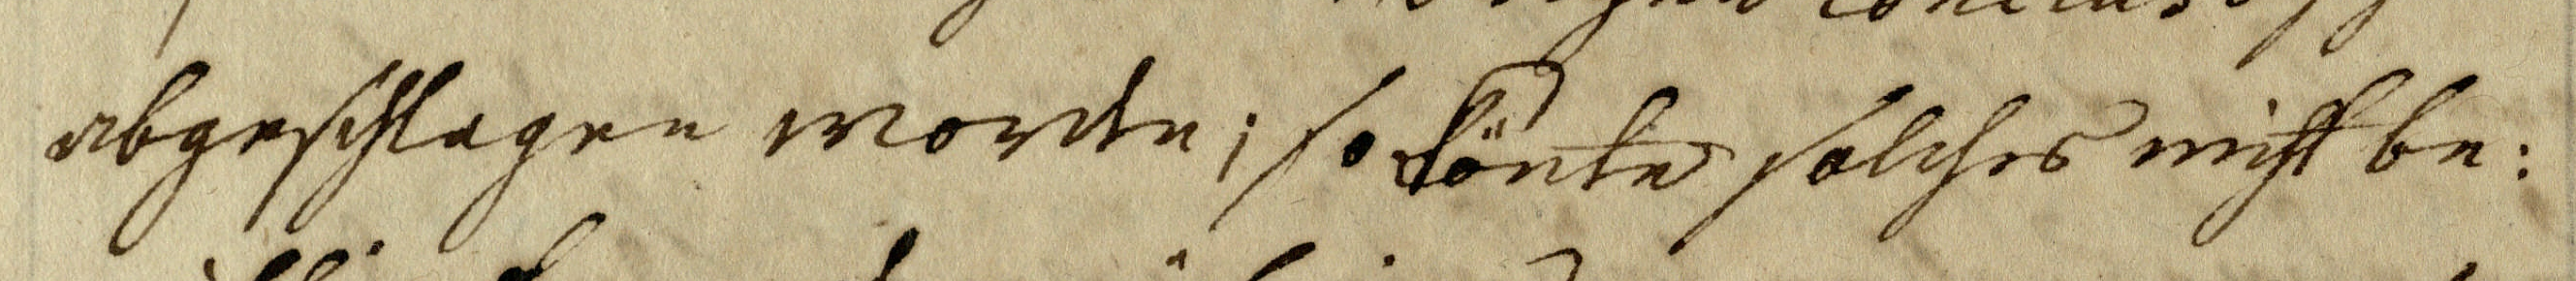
abgeschlagen worden; so könte solches nicht be¬
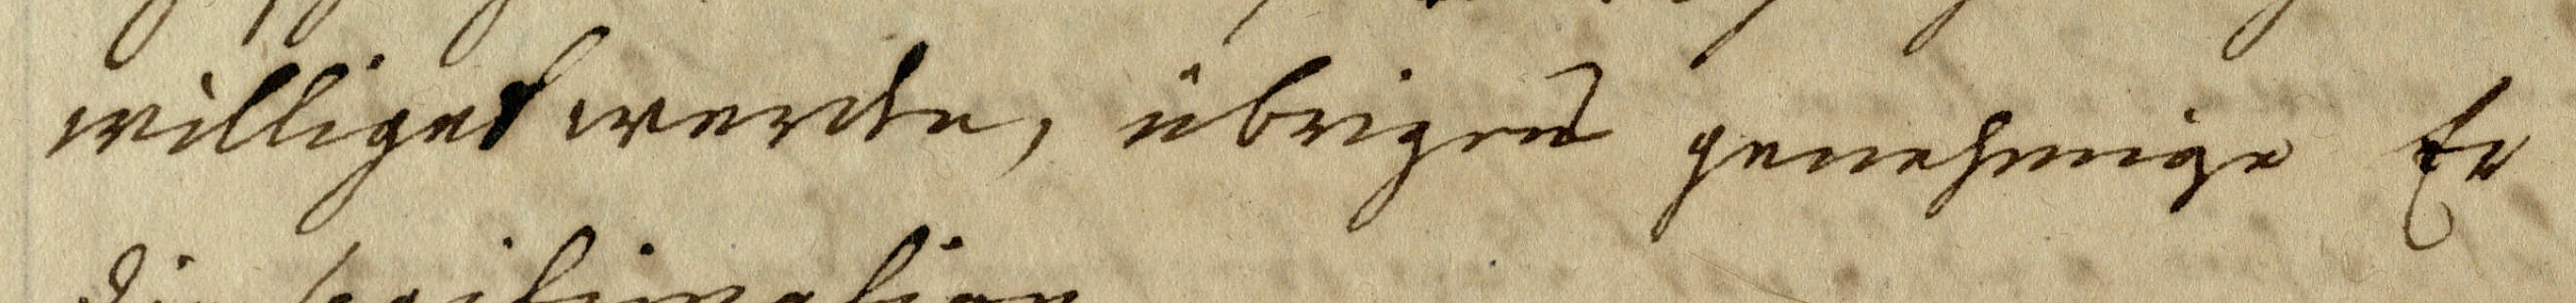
williget werden, übrigens genehmige Er
